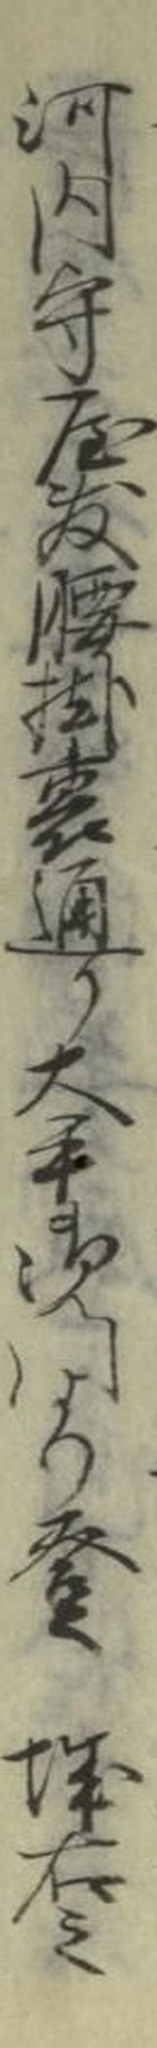河内守屋敷腰掛裏通り大手御門より登城右之
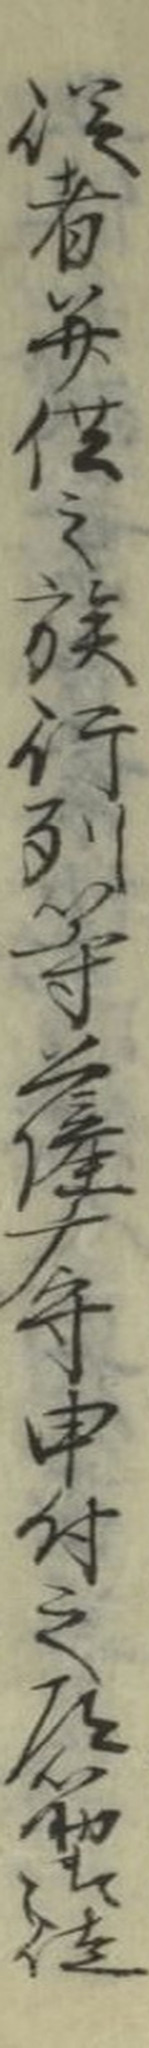従者幷供之族行列等薩摩守申付之道筋御徒
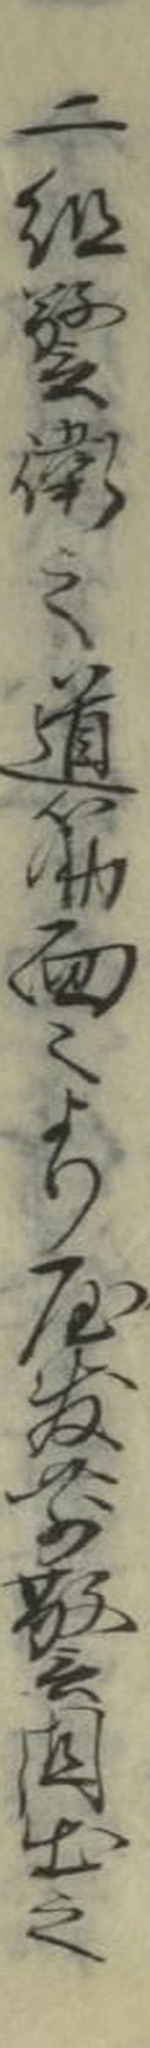二組警衛之道筋面々より屋敷前警固出之
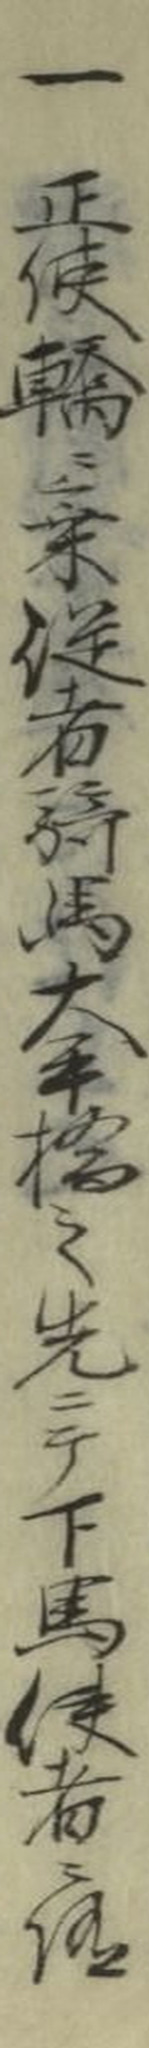一正使轎に乗従者騎馬大手橋之先にて下馬使者に随
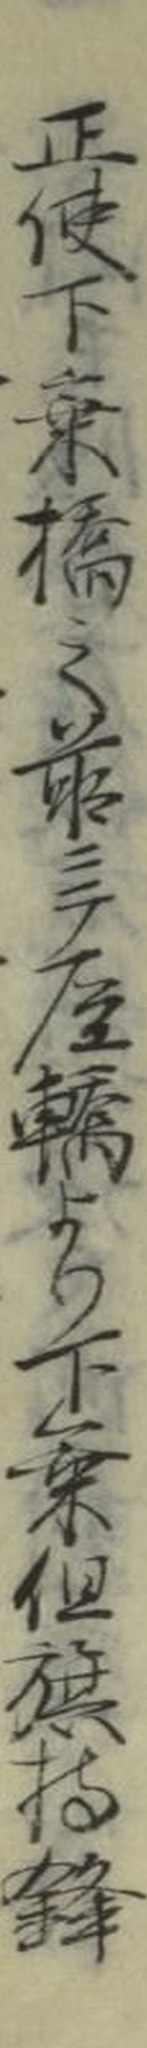正使下乗橋之前にて屋轎より下乗但旗持鋒
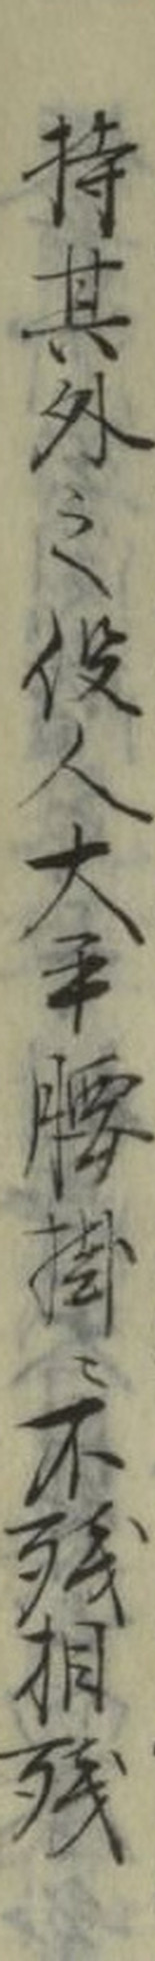持其外之役人大手腰掛に不残相残

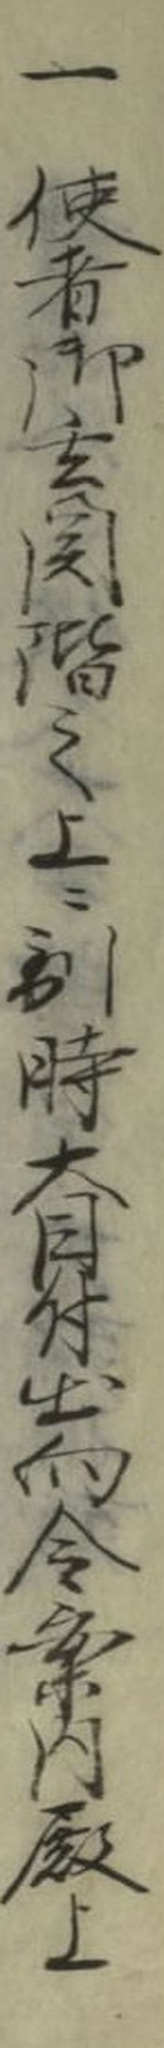一使者御玄関階之上に到時大目付出向令案内殿上
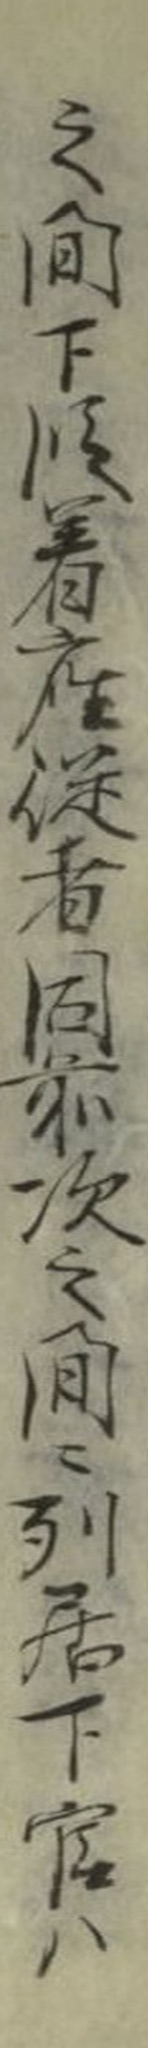之間下段着座従者同前次之間に列居下官は
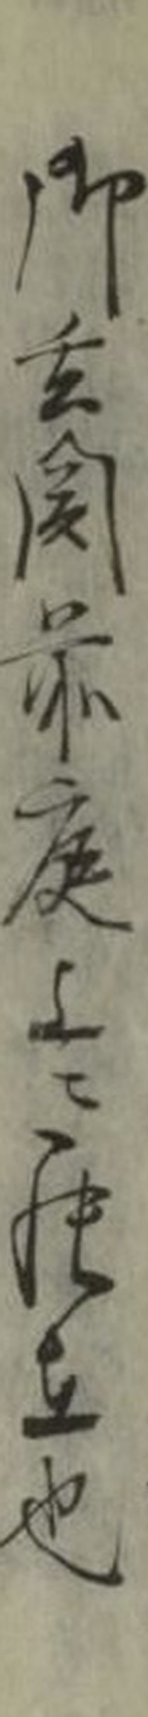御玄関前庭上に罷在也
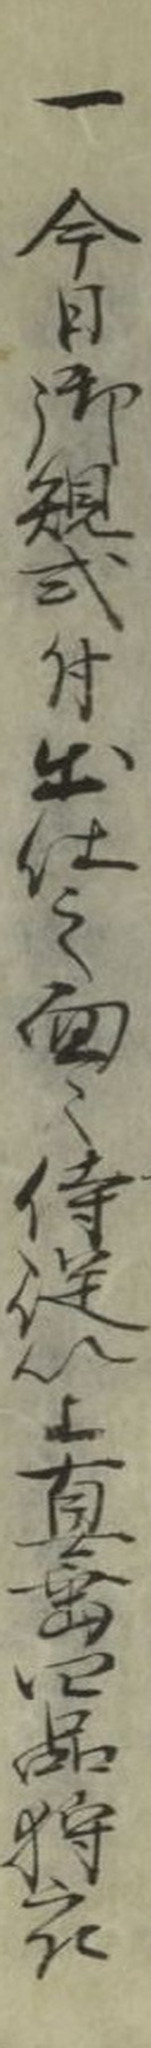一今日御規式付出仕之面々侍従以上直垂四品狩衣
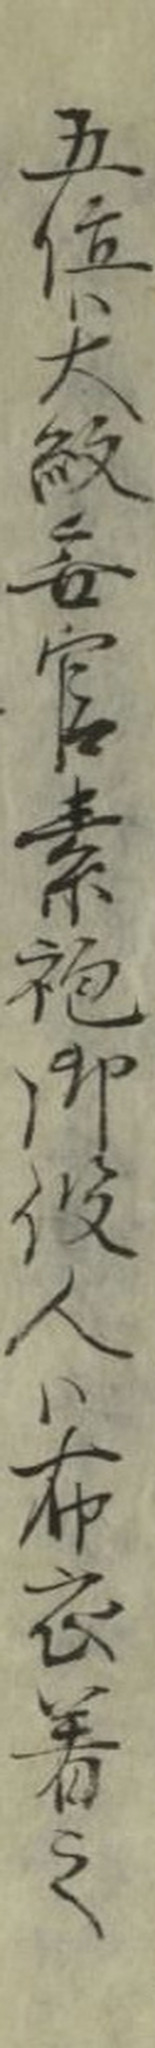五位は大紋無官素袍御役人は布衣着之
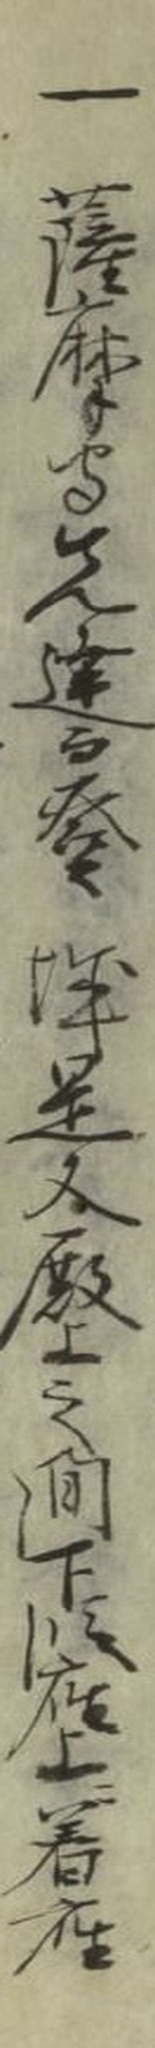一薩摩守先達而登城是又殿上之間下段座上に着座
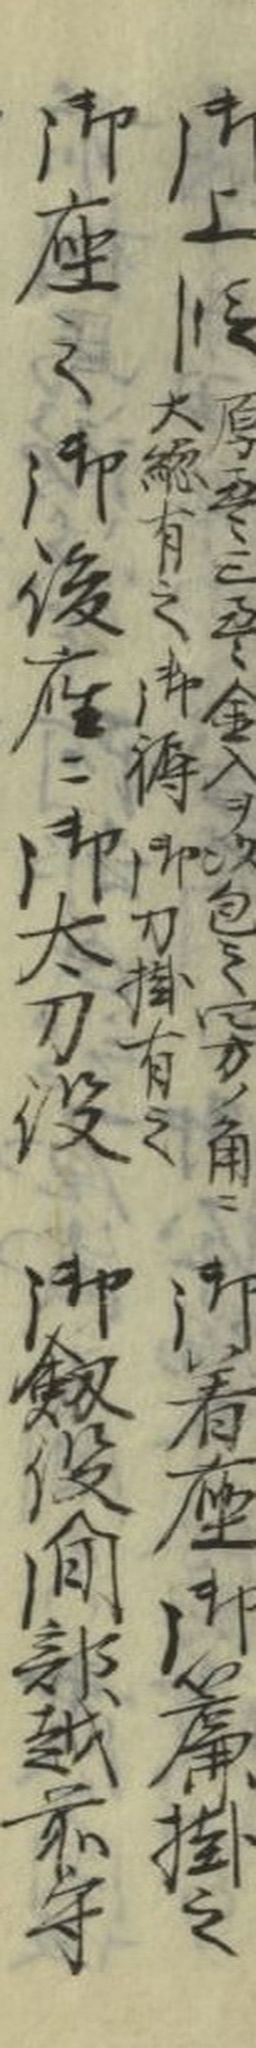御座之御後座に御太刀役御剣役間部越前守
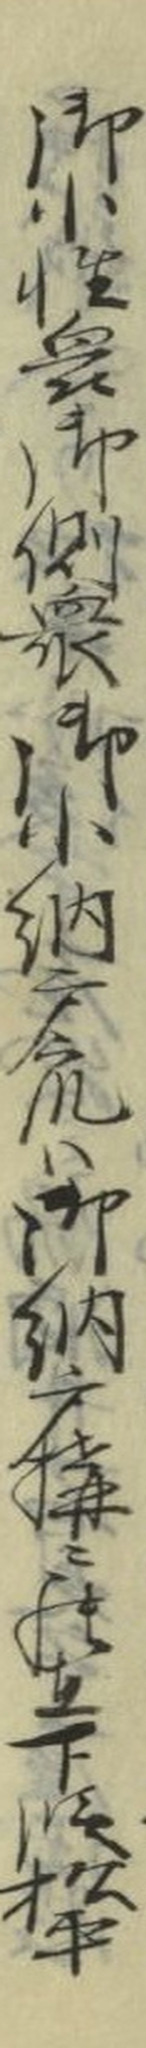御小性衆御側衆御小納戸衆は御納戸構に罷在下段松平
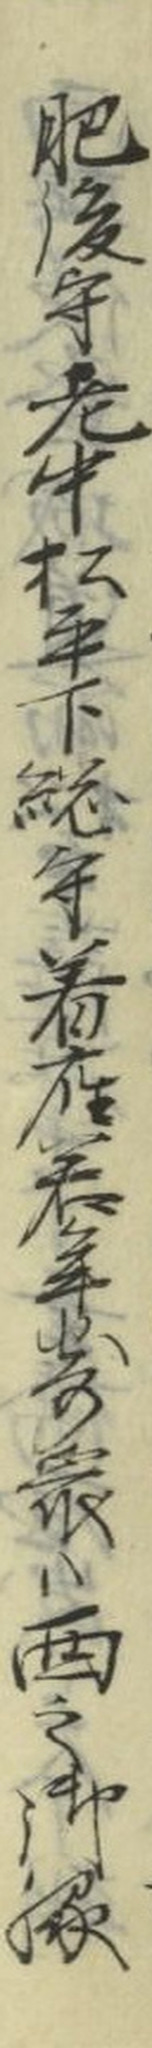肥後守老中松平下総守着座若年寄衆は西之御縁
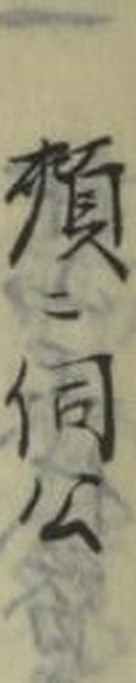頬に伺公
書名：宝永七庚寅年琉球国来聘使日記
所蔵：University of the Ryukyus Library
